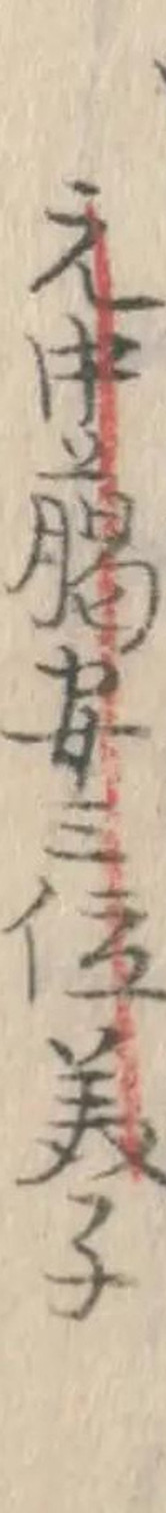元中臈安三位美子
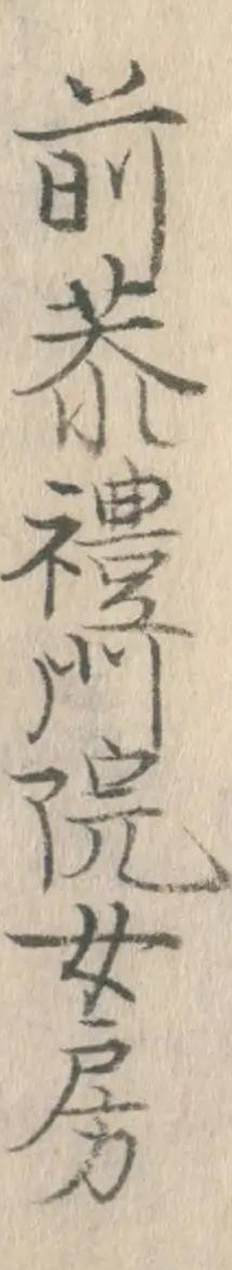前恭礼門院女房

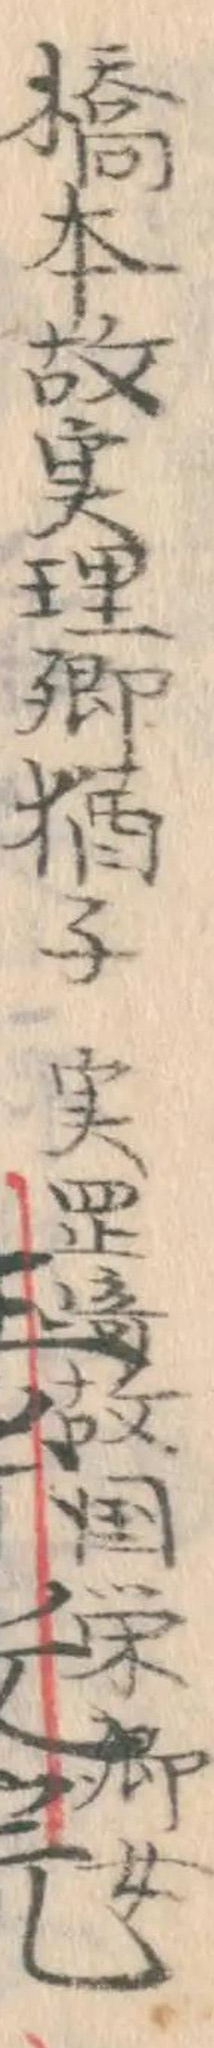橋本故実理卿猶子実岡崎故国栄卿女
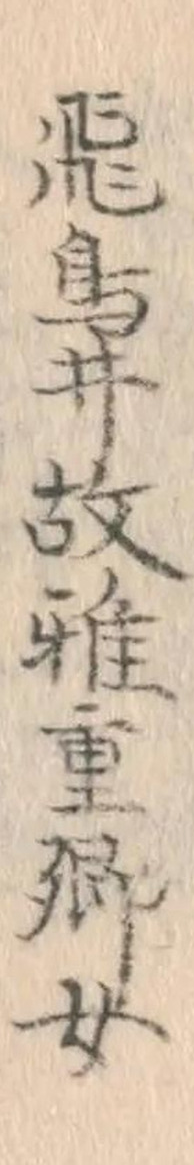飛鳥井故雅重卿女
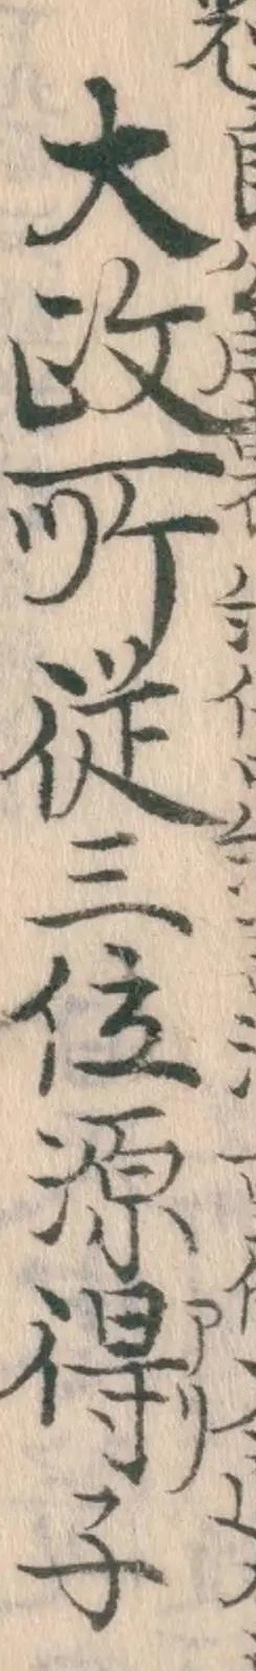政所従三位源富子
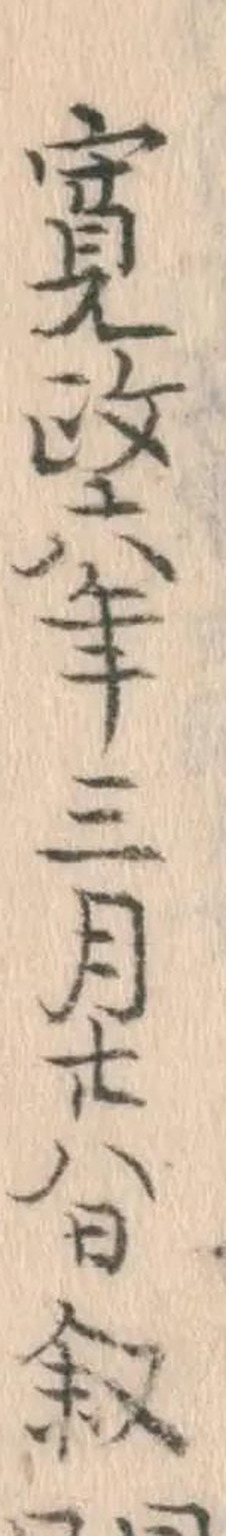文政六年三月廿五日叙
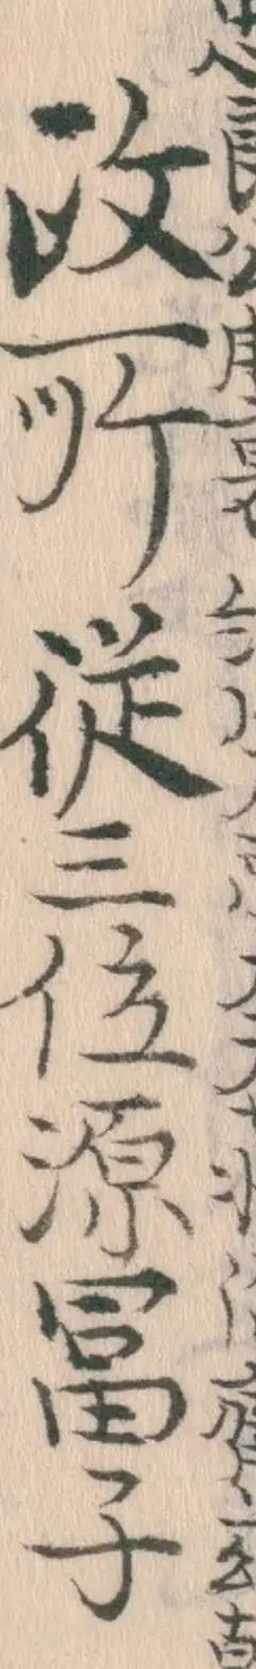政所従三位源富子
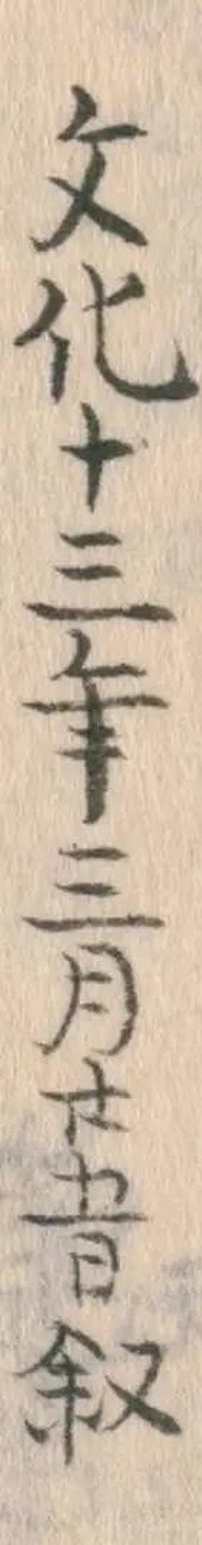文化十三年三月廿五日叙
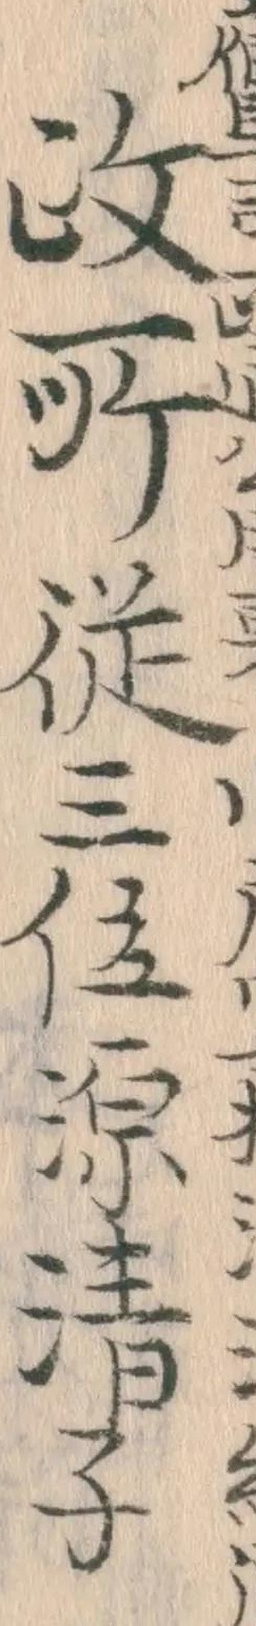政所従三位源清子
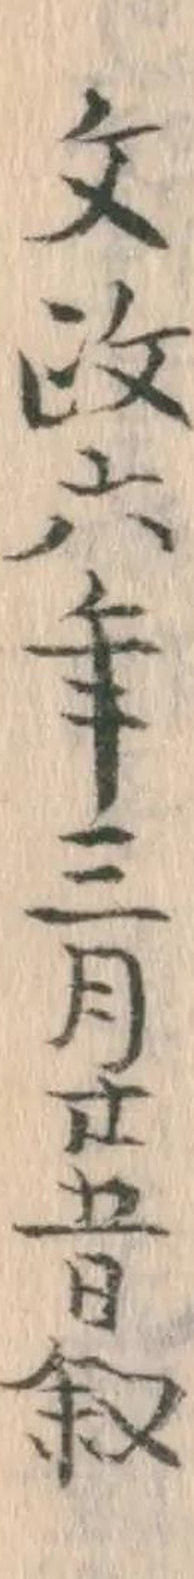文政六年三月廿五日叙
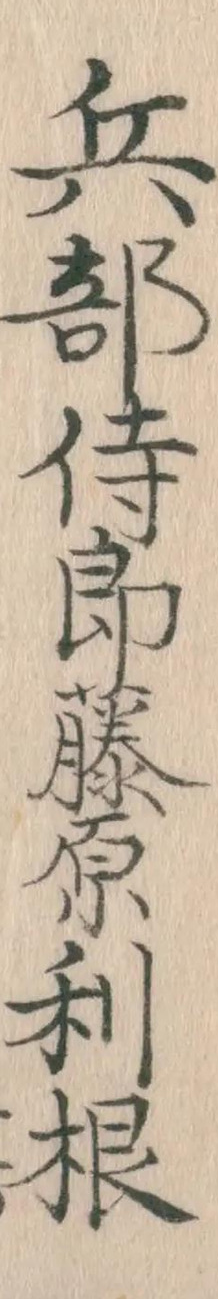兵部侍郎藤原利根
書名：賀茂社記録. 第80冊
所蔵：国立国会図書館 National Diet Library, JAPAN
